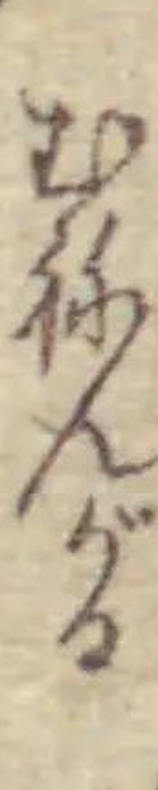むねんがる

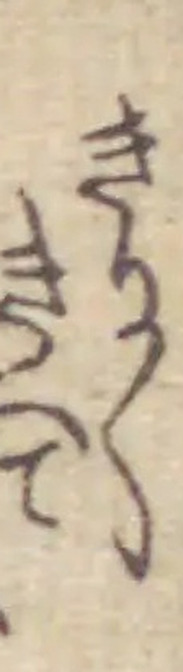きり〳〵
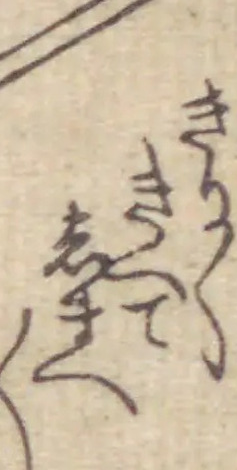しまへ
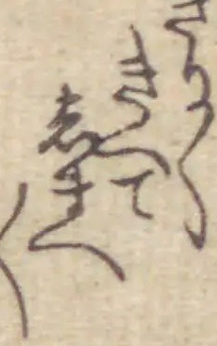しまへ
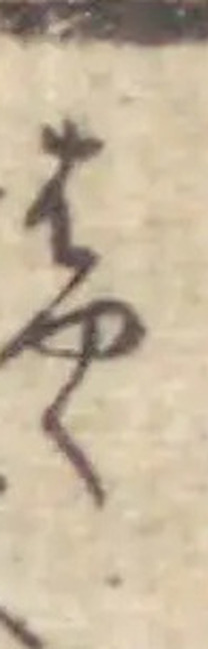はやく
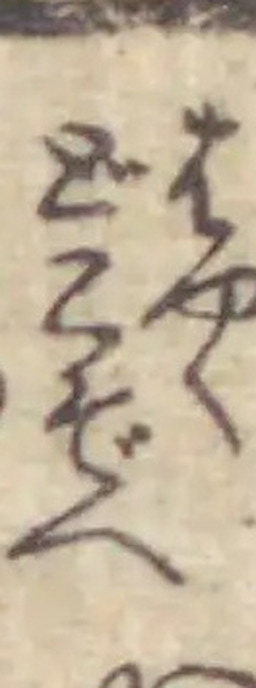どこぞへ
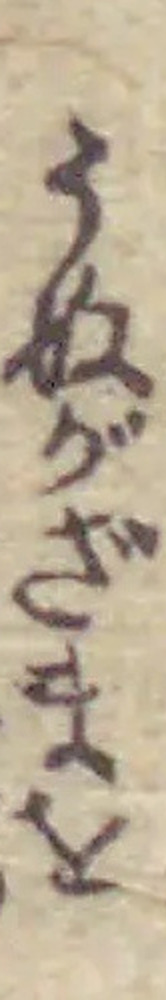うぬがざまを
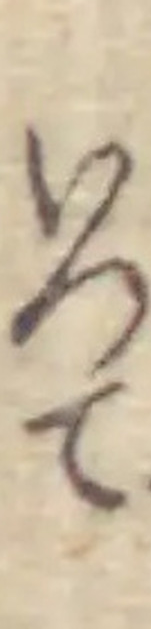いつて
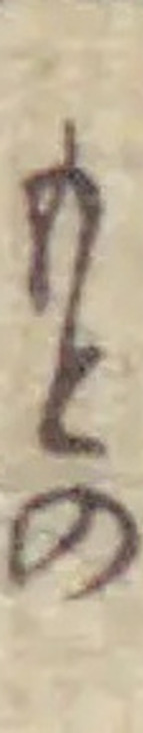もとの
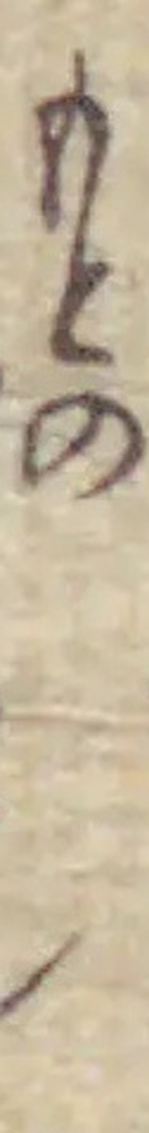もとの
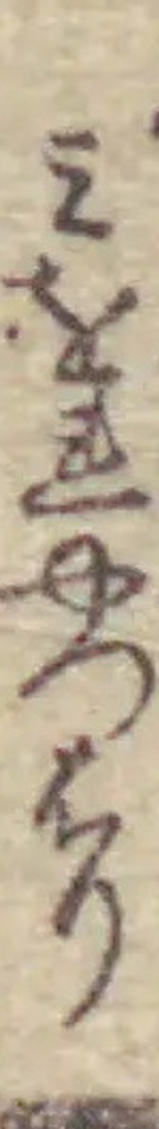みをれやつはり
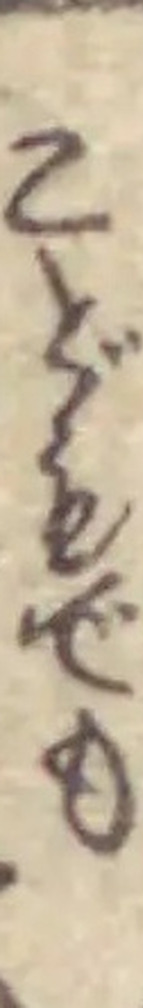こどもでも
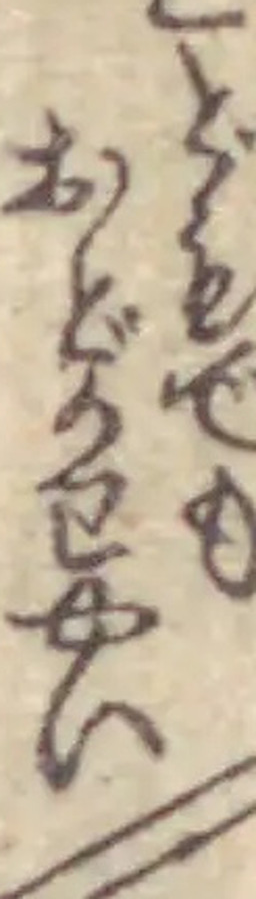おどかせやい
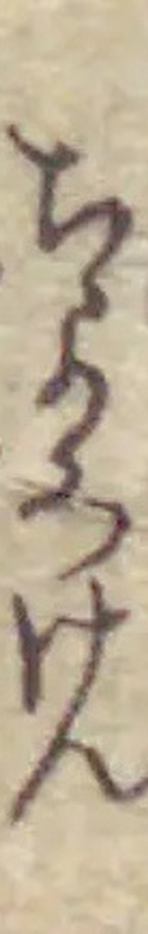ちよろけん
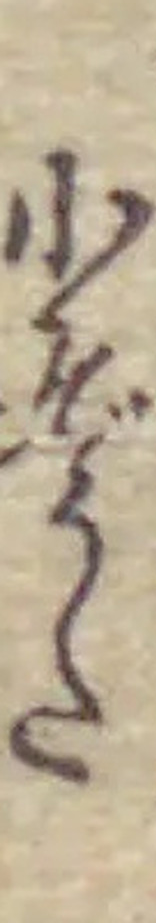小ぞうた
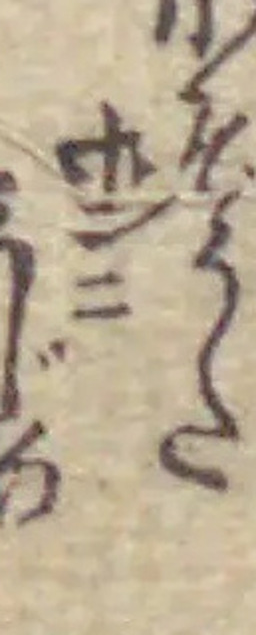ホンニ
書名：大昔化物双紙 2巻
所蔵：国立国会図書館 National Diet Library, JAPAN
